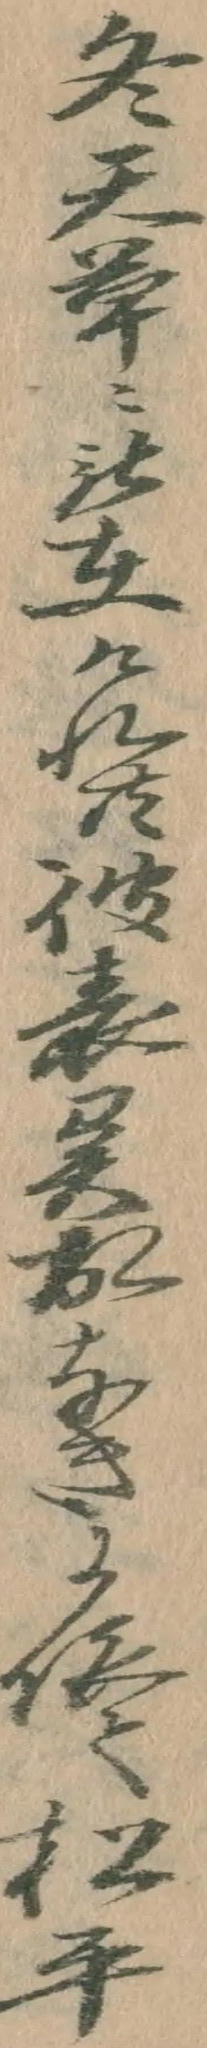冬天草に被在けれ共彼表異故なき尓依て松平
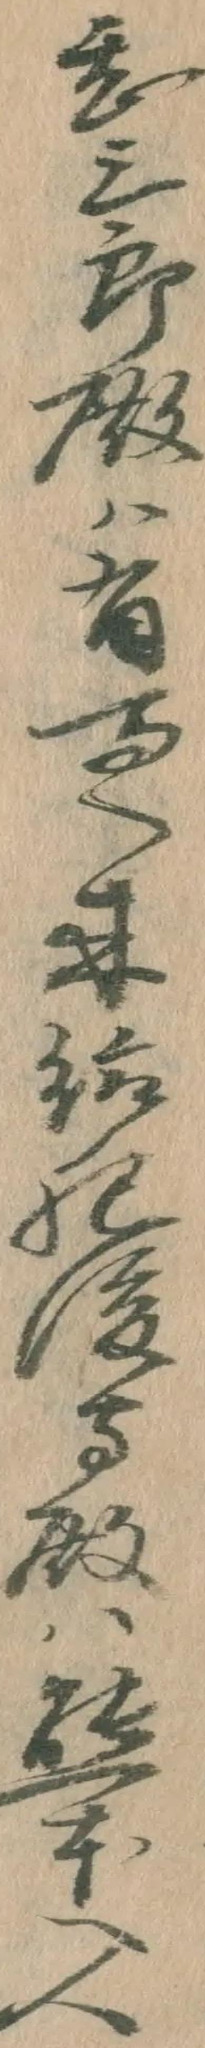甚三郎殿は有馬へ来給肥後守殿は熊本へ人
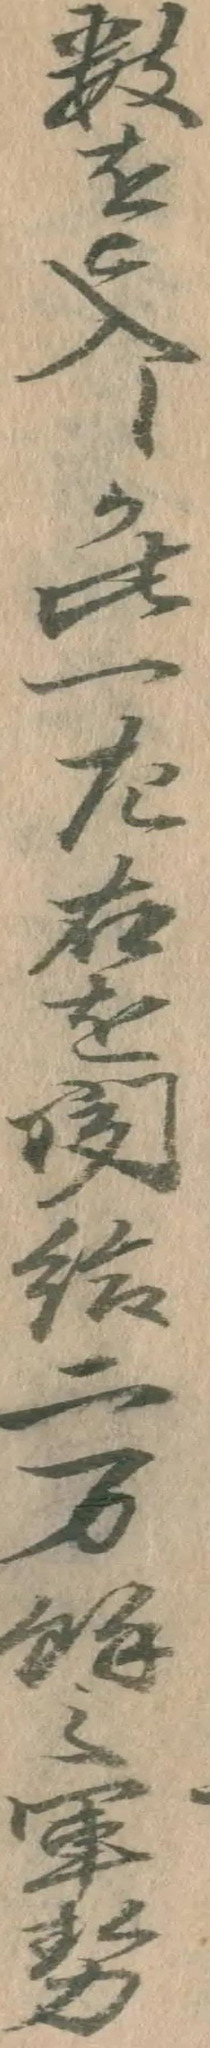数を被入しか此一左右を聞給二万余之軍勢
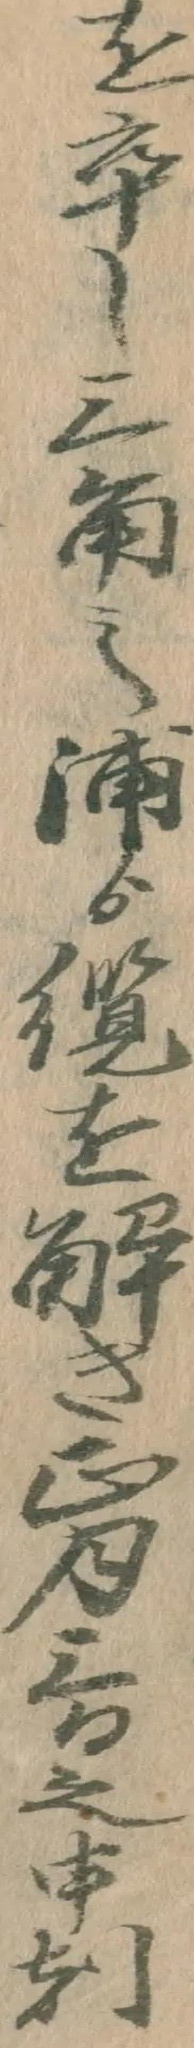を卒し三角之浦ゟ纜を解き正月三日之申刻
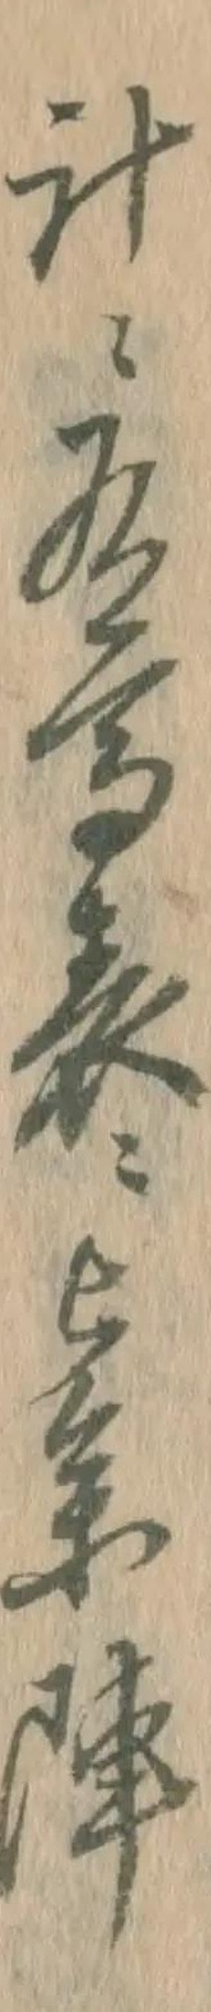斗に有馬表に被参陣
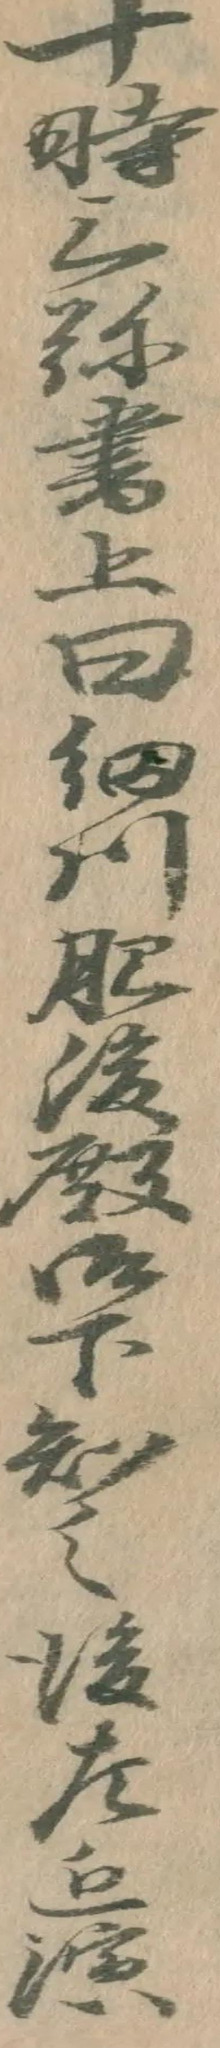十時三弥書上曰細川肥後殿御下知之後左近浜
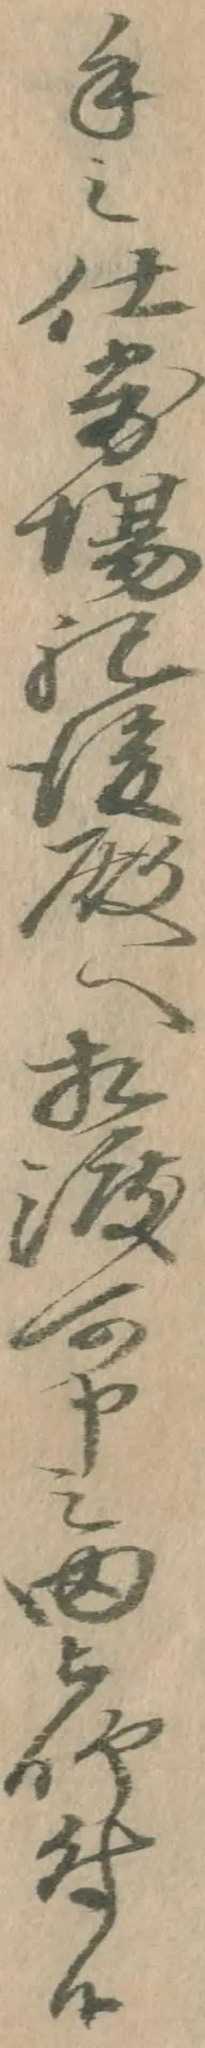手之仕寄場肥後殿へ相渡可申之由被仰付候
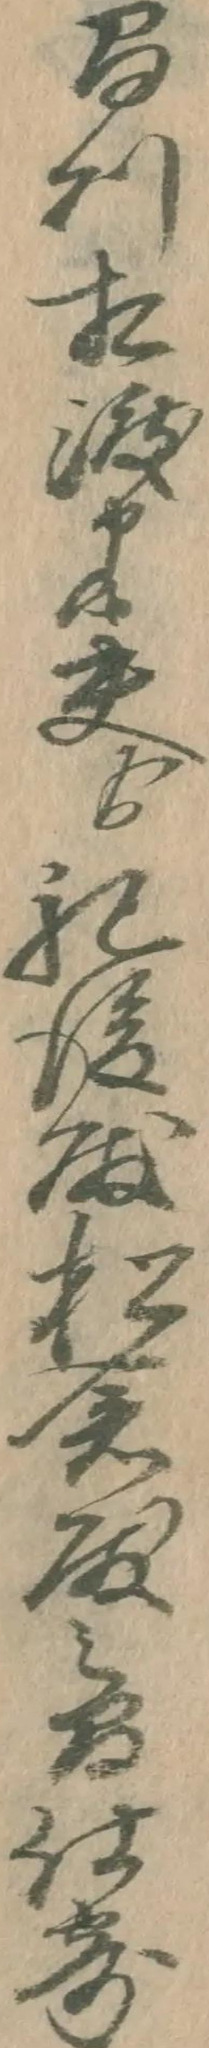間則相渡申候夫ゟ肥後殿松倉殿之間仕寄

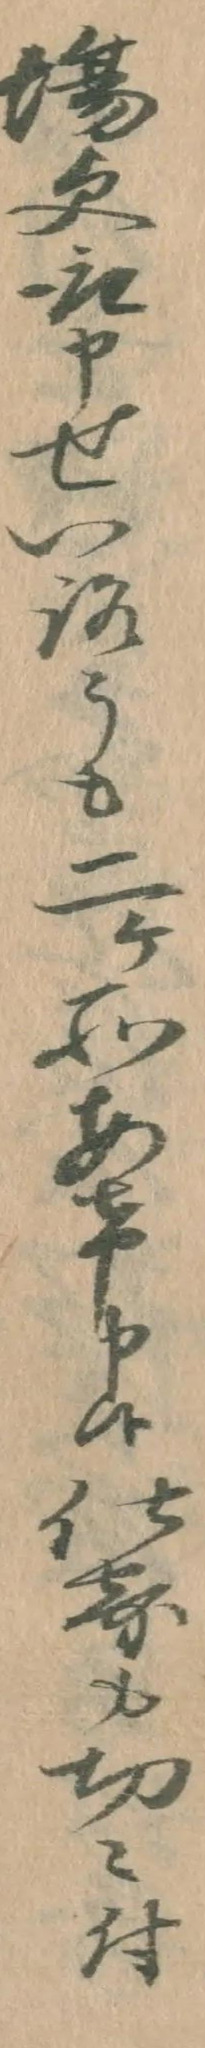場受取申せい路うも二け所あ希申候仕寄も切に付
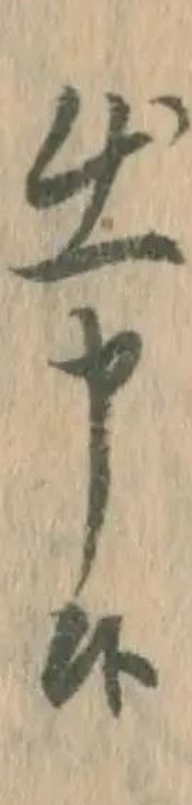出申候
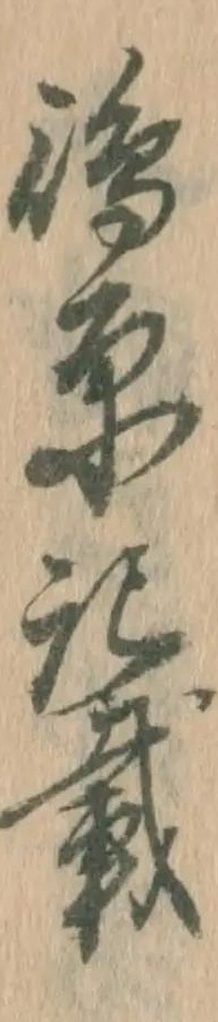島原記載
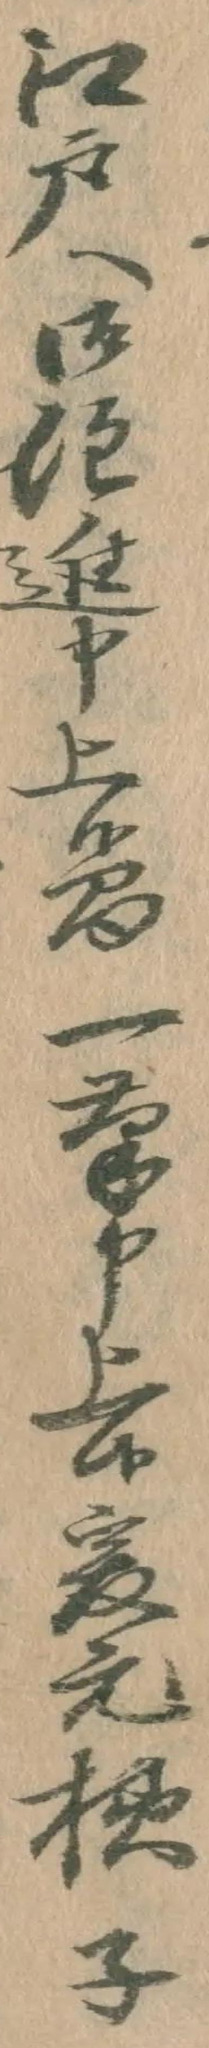江戸へ御注進申上候間一筆申上候爰元様子
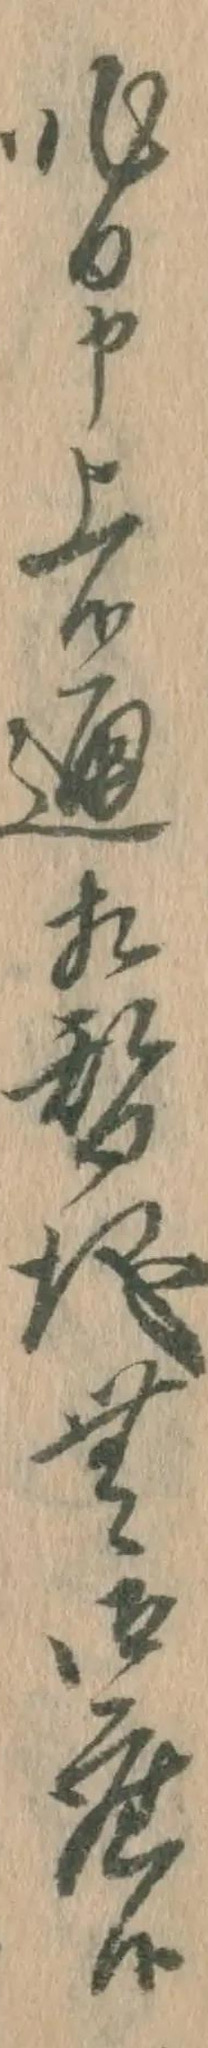昨日申上候通相替儀無御座候
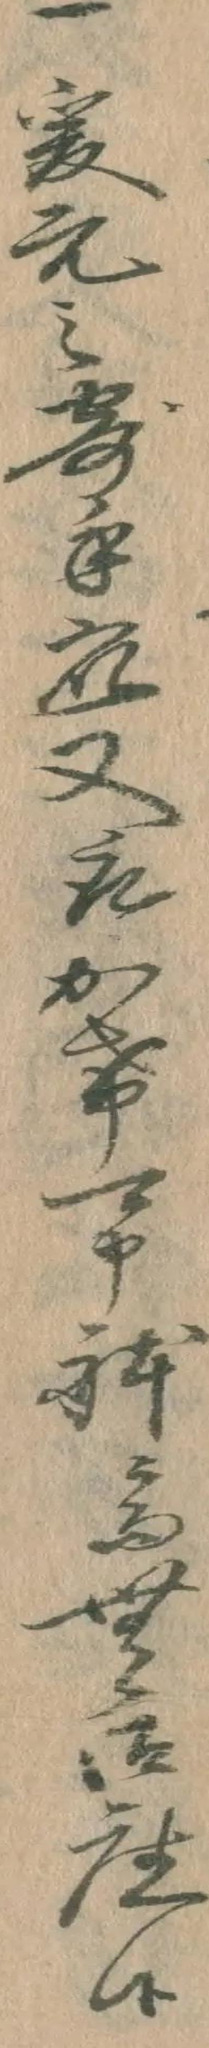一爰元之寄手衆又取加希可申躰に而無御座候
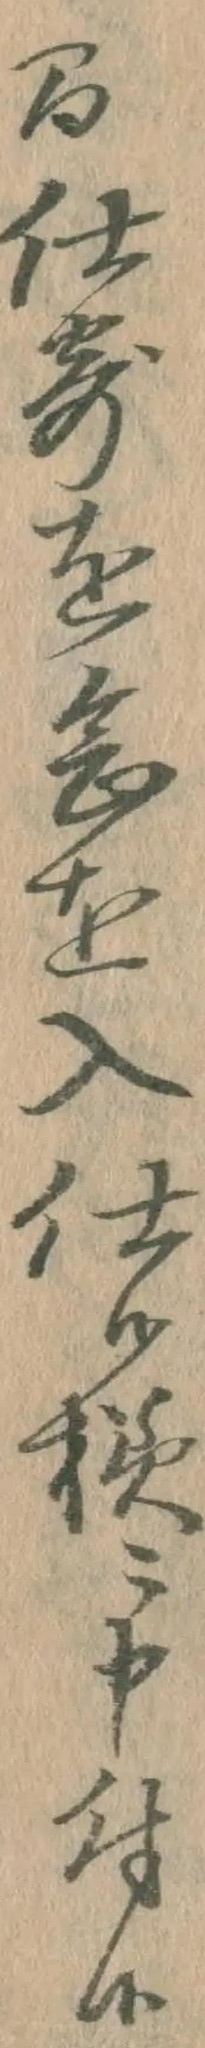間仕寄を急を入仕候様に申付候
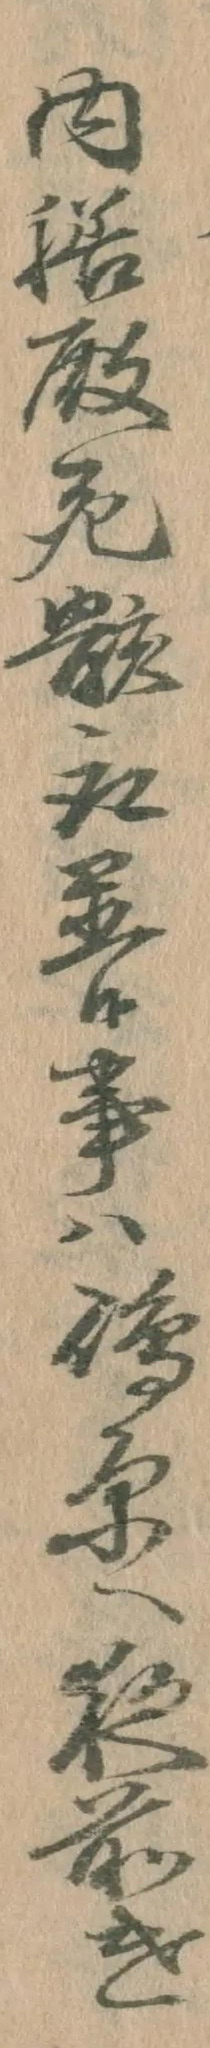一内膳殿死骸取置候事は島原へ夜前遣
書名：切支丹御退治記 49巻. [5]
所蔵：国立国会図書館 National Diet Library, JAPAN
